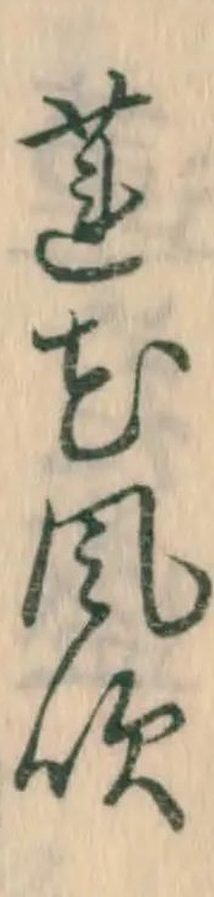蓮花風吹
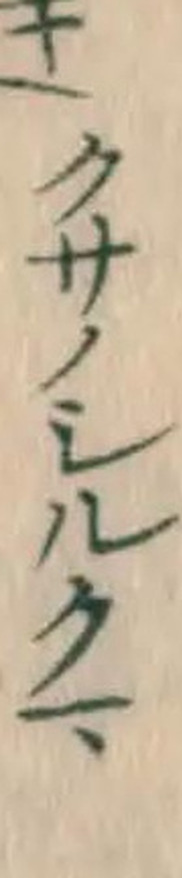クサノシルクマ
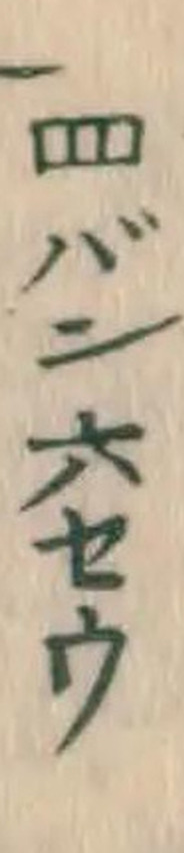四バン六セウ

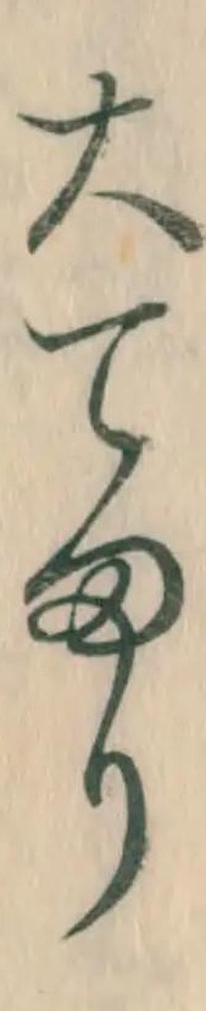大てまり

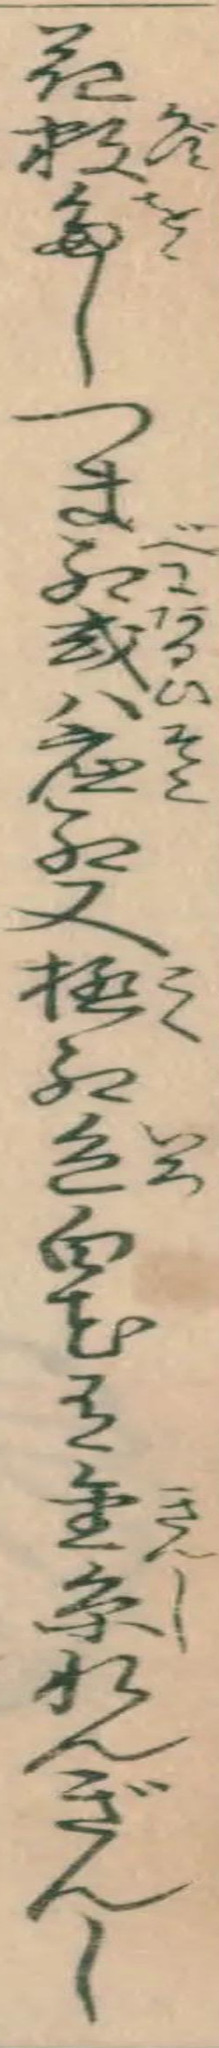花数多しつま紅或は底紅又極紅色白花有金糸れんぎんし
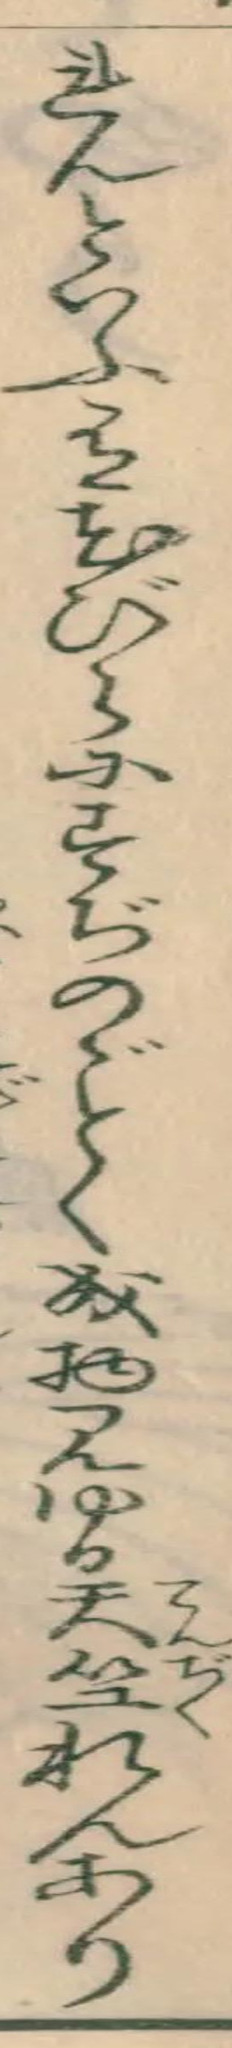れんといふ有花びらにすぢのごとく成物見ゆる天竺れんあり
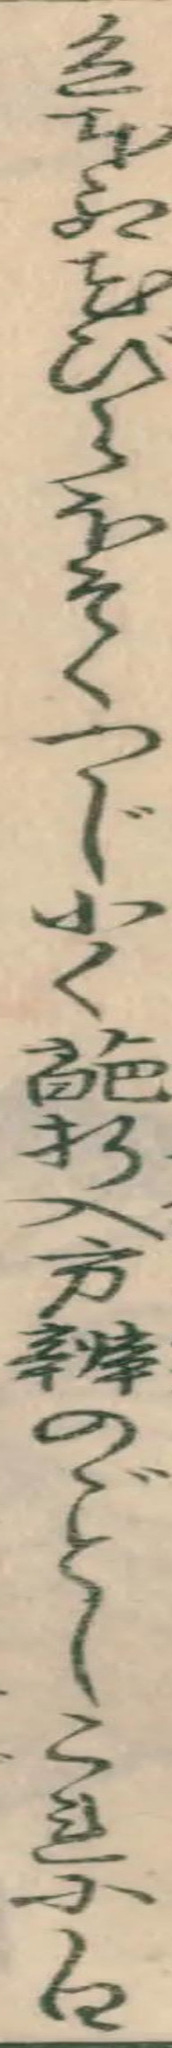色本紅花びらほそくつじ小く葩折入方弁のごとしこれに白
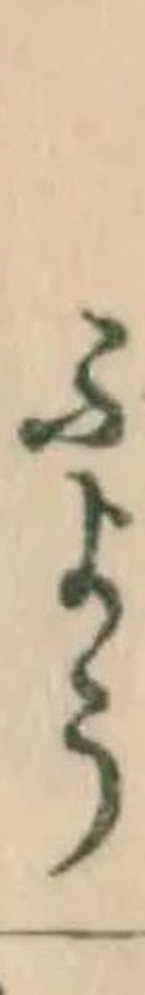ふよう
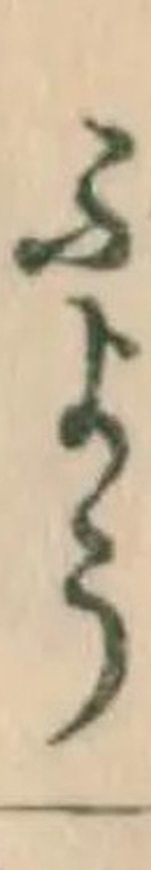ふよう
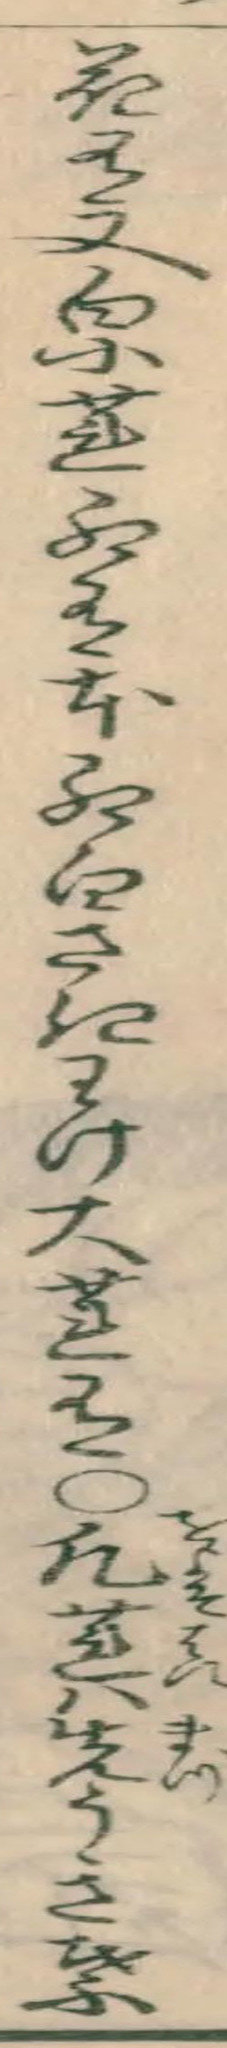花有又白に蓮紅有本紅白さきわけ大蓮有○凡蓮は先うき葉
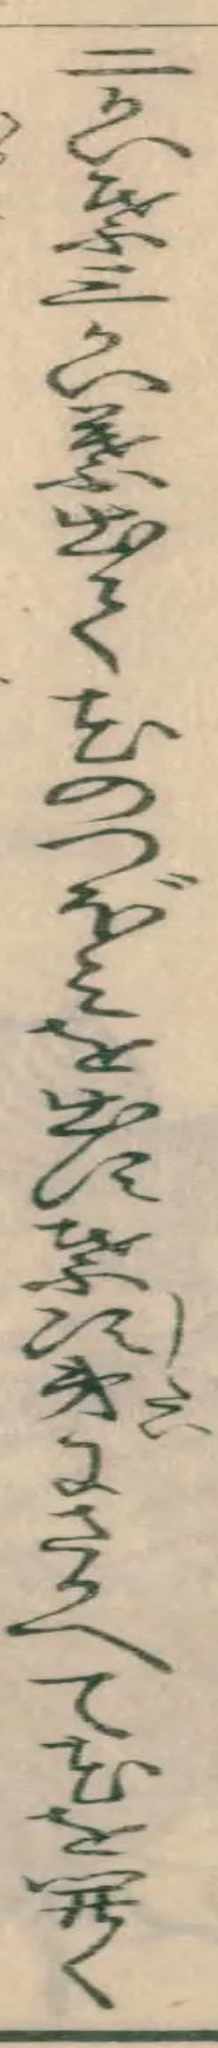二かい葉三かい葉出て花のつぼみを出す葉次第にさかへて花を開く
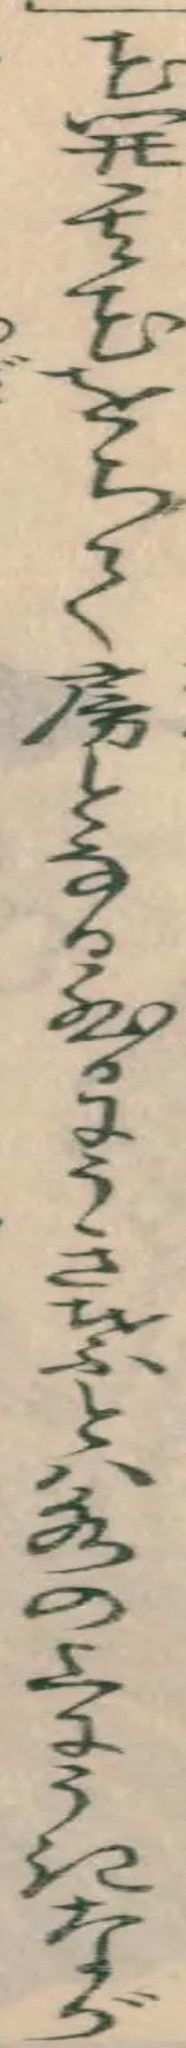花開其花をちて房となる然るにうき葉とは水の上にうきなが
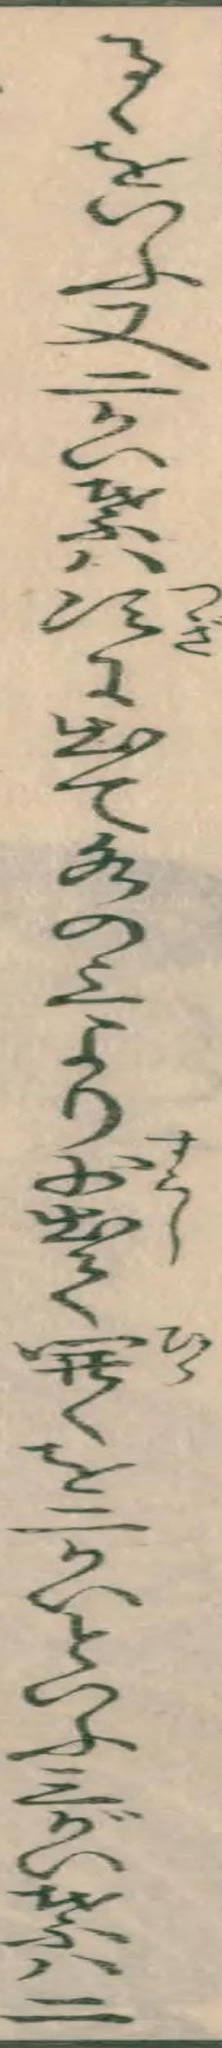るゝをいふ又二かい葉は次に出て水の上より少出て開くを二かいといふ三がい葉は二
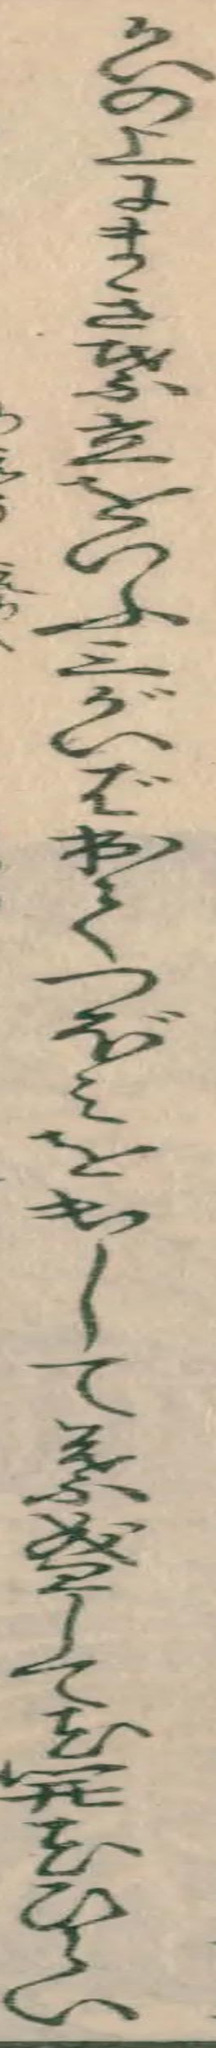かいの上にまき葉立をいふ三がいば出てつぼみを出して葉盛して花開花ひらい
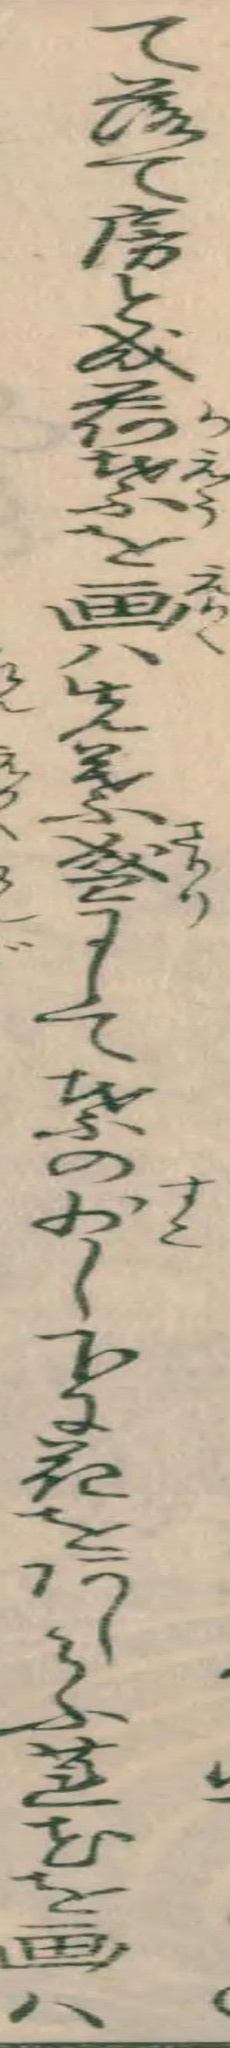て落て房と成荷葉を画は先葉盛にして葉の少し下に花をあしらふ蓮花を画は
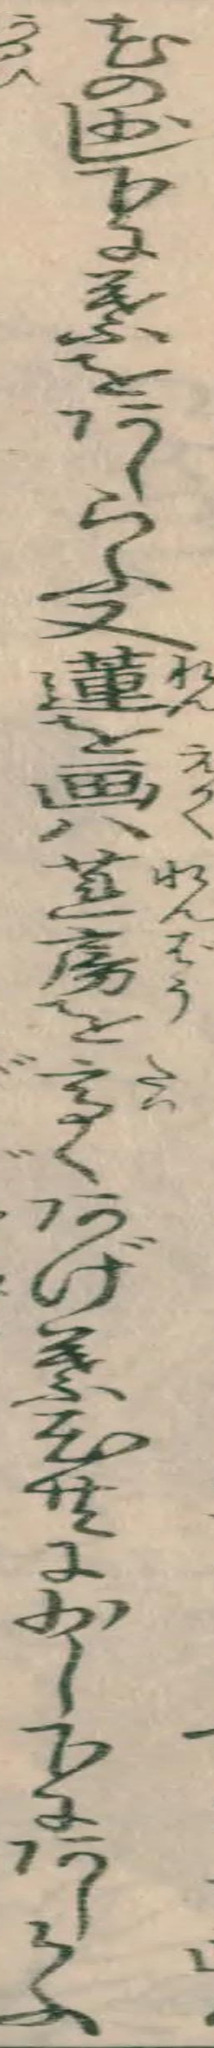花の少し下に葉をあしらふ又蓮を画は蓮房を高くあげ葉花共に少し下にあしらふ
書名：畫本野山草. [5]
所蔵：国立国会図書館 National Diet Library, JAPAN
